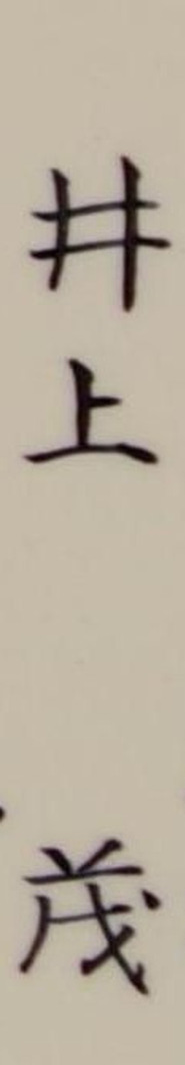井上茂
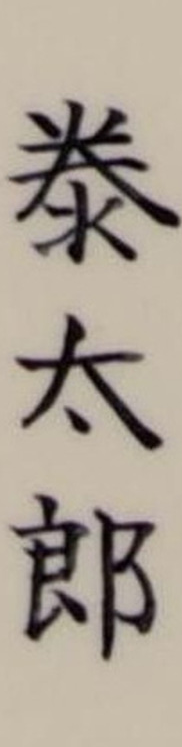泰太郎
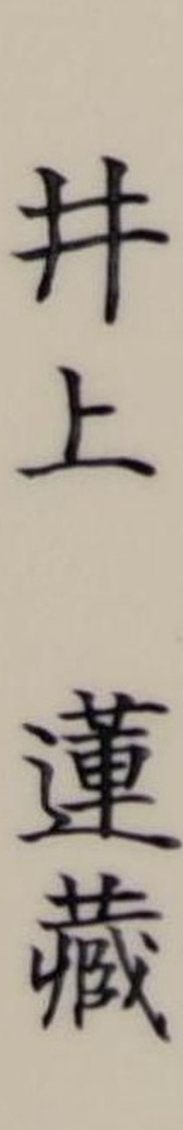井上蓮蔵
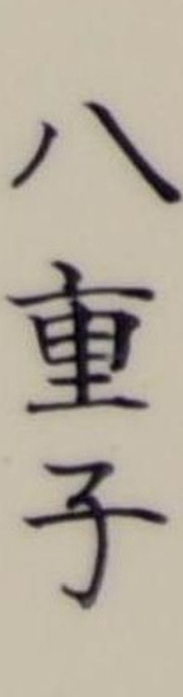八重子
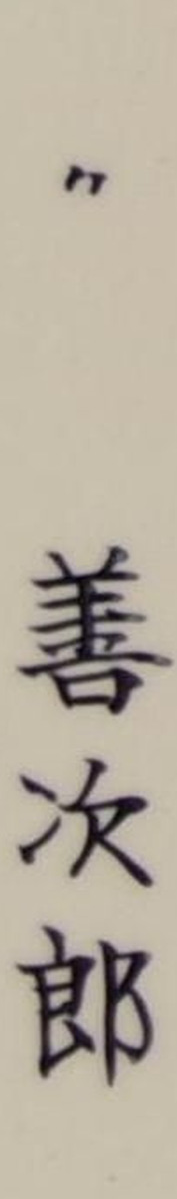善次郎
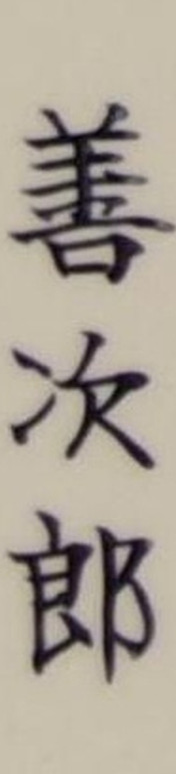善次郎
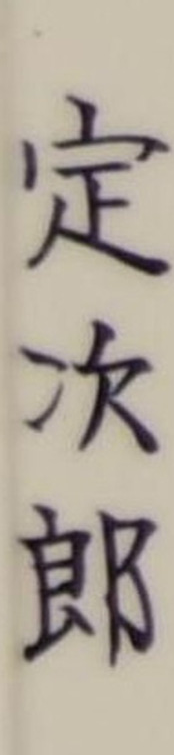定次郎

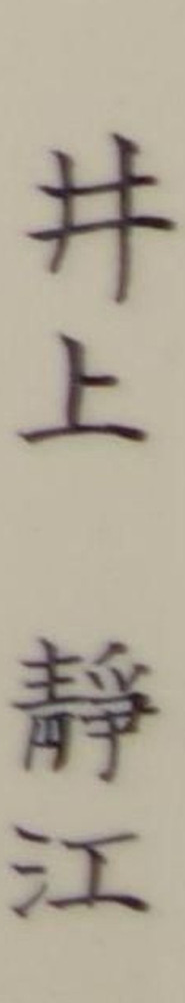井上静江
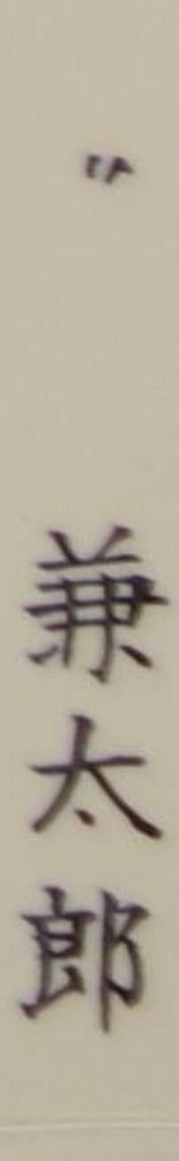兼太郎
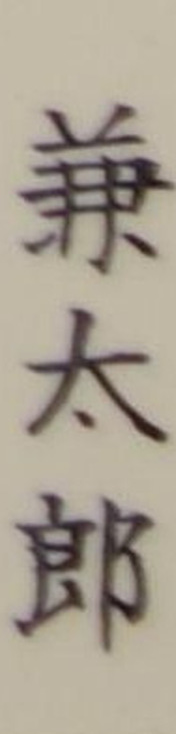兼太郎
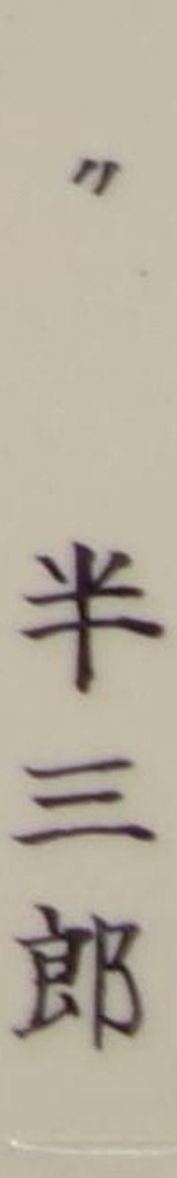半三郎
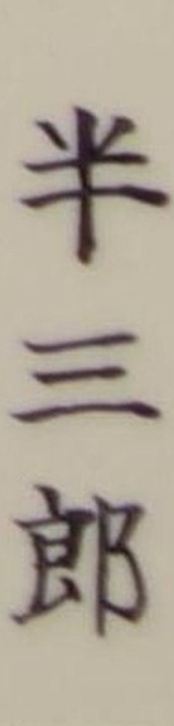半三郎
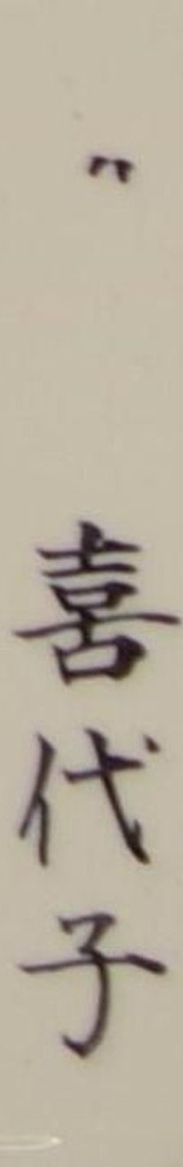喜代子
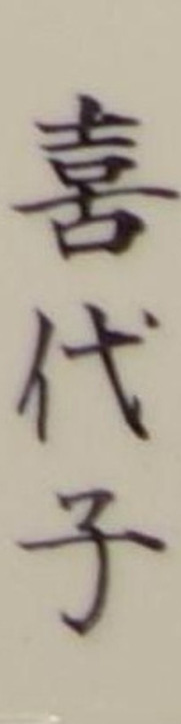喜代子
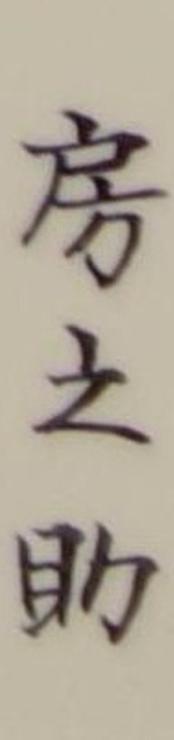房之助
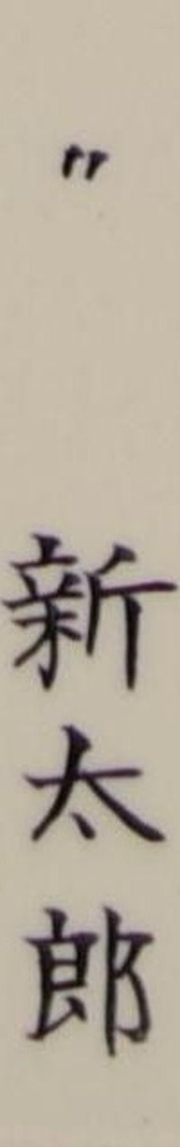新太郎
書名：M~S
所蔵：高野山金剛峯寺
